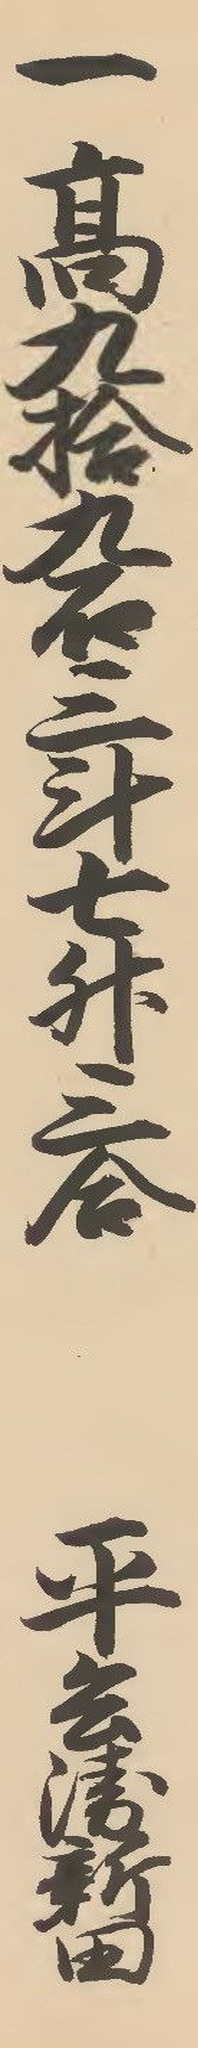一高九拾九石三斗七升三合平兵衛新田
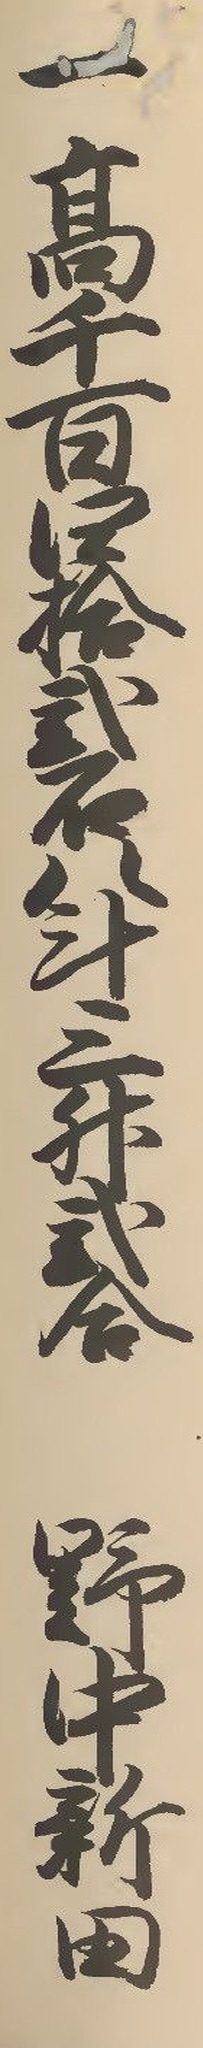一高千百四拾弐石八斗三升弐合野中新田
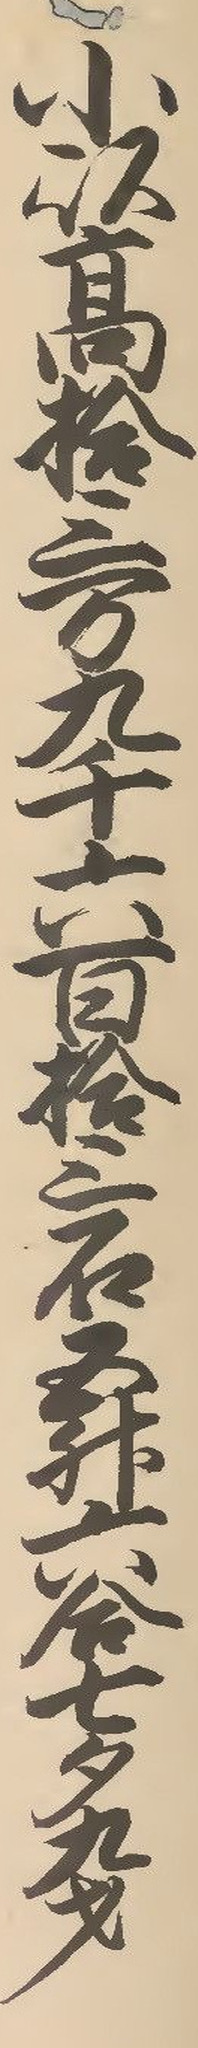小以高拾三万九千六百拾三石五升六合七勺九才

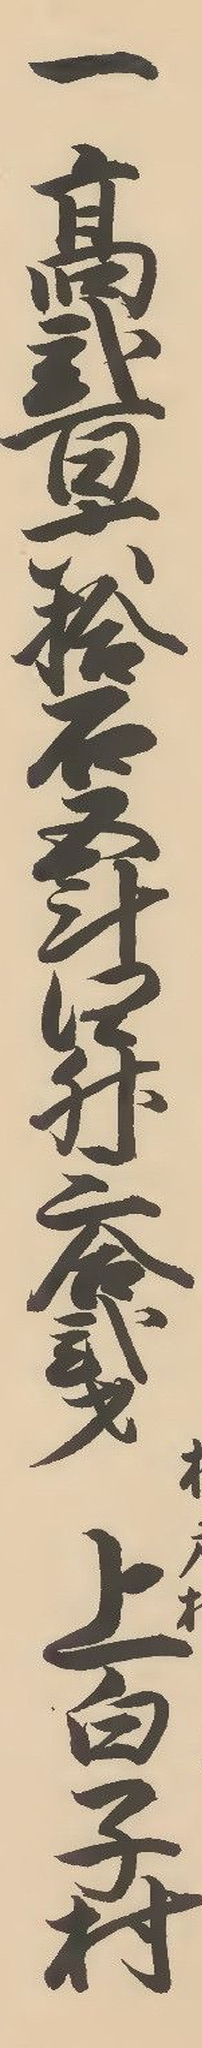一高弐百六拾石五斗四升三合弐才上白子村
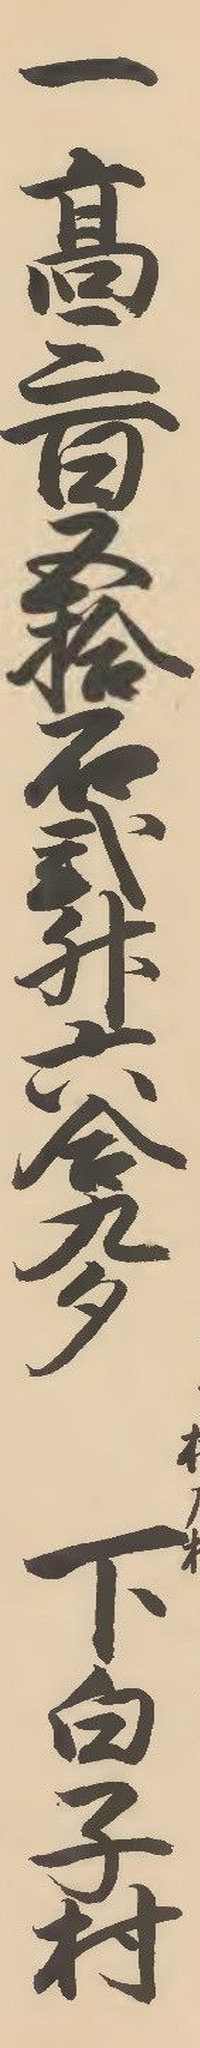一高三百五拾石弐升六合九勺下白子村
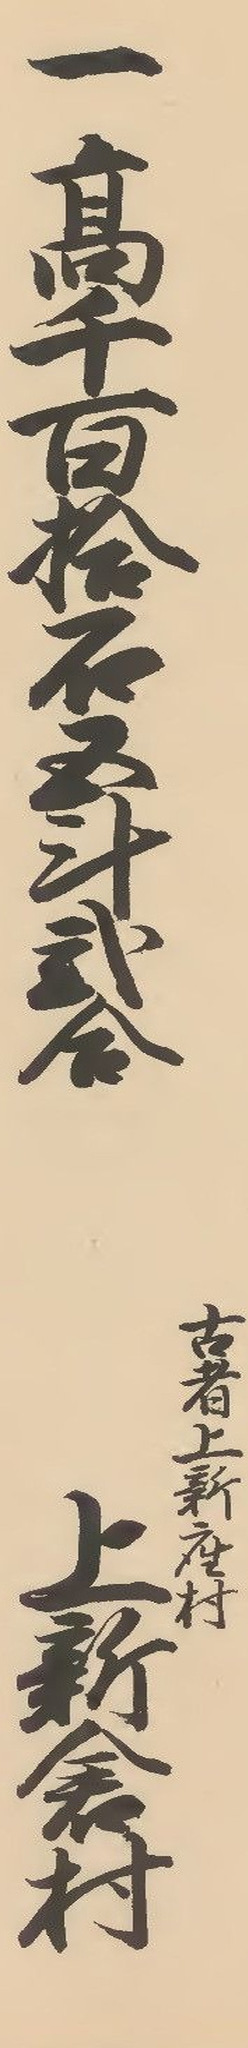一高千百拾石五斗弐合上新倉村
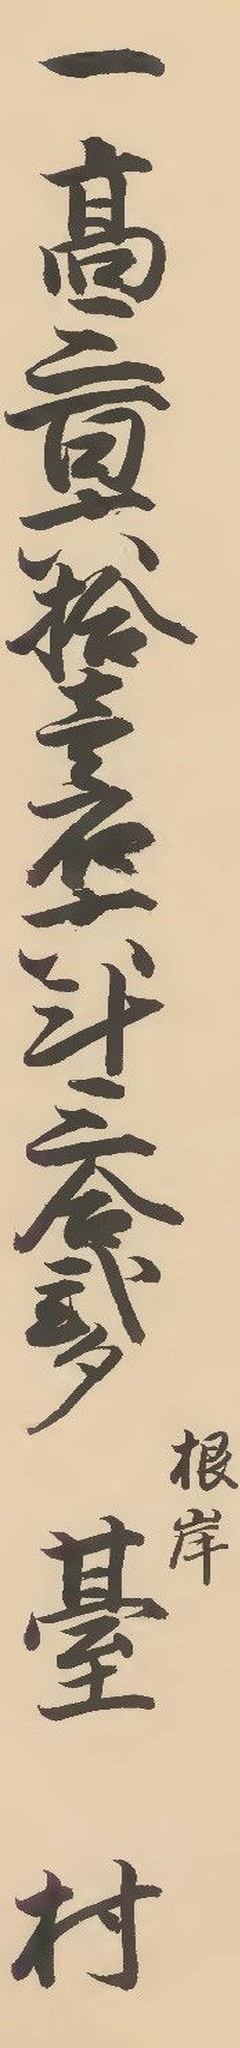一高三百六拾壱石六斗三合弐勺䑓村

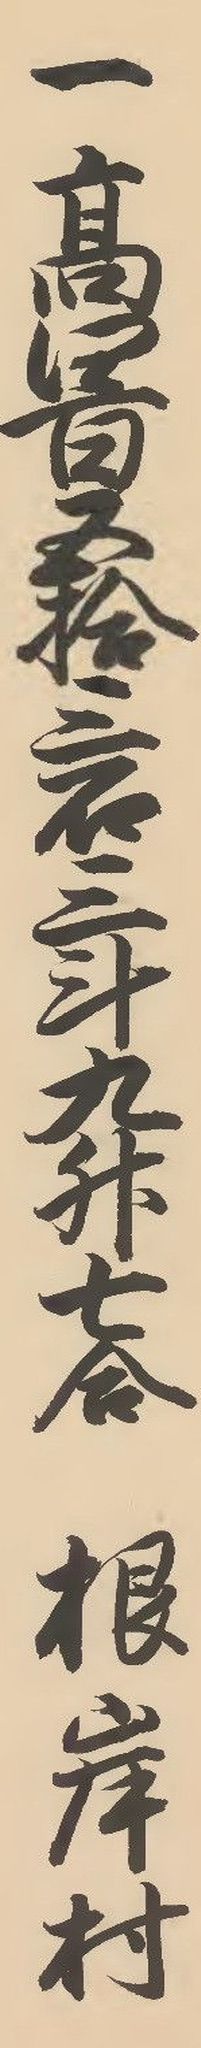一高四百五拾三石三斗九升七合根岸村
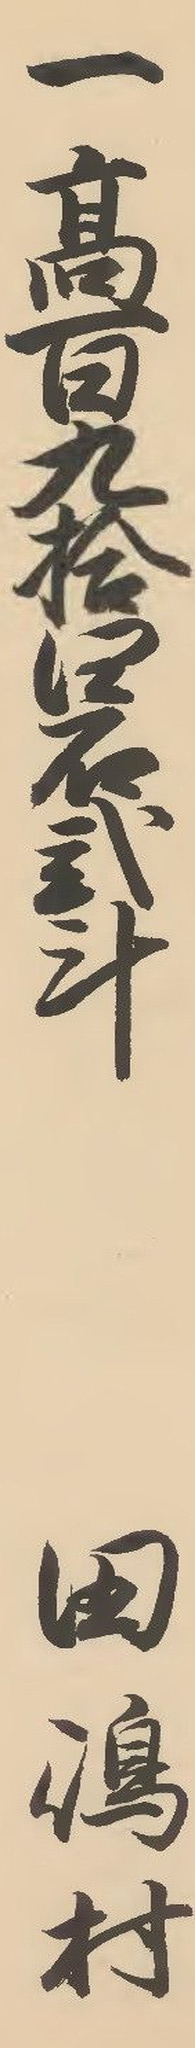一高百九拾四石弐斗田嶋村
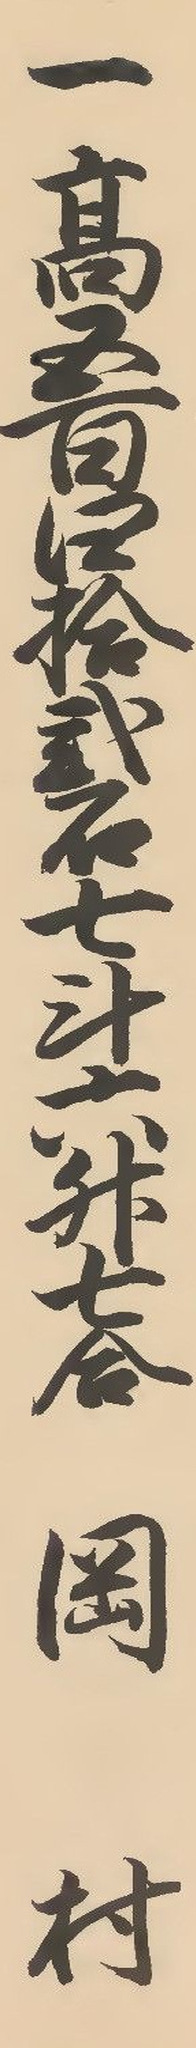一高五百四拾弐石七斗六升七合岡村
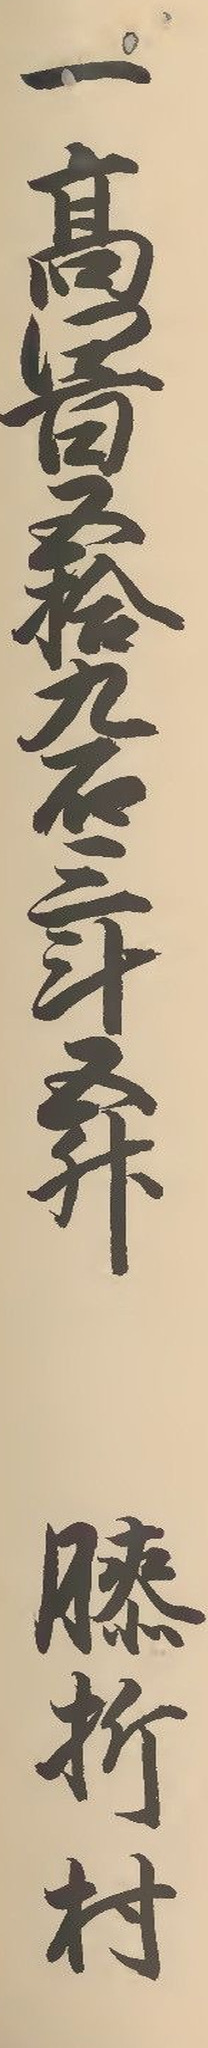一高四百五拾九石三斗五升膝折村
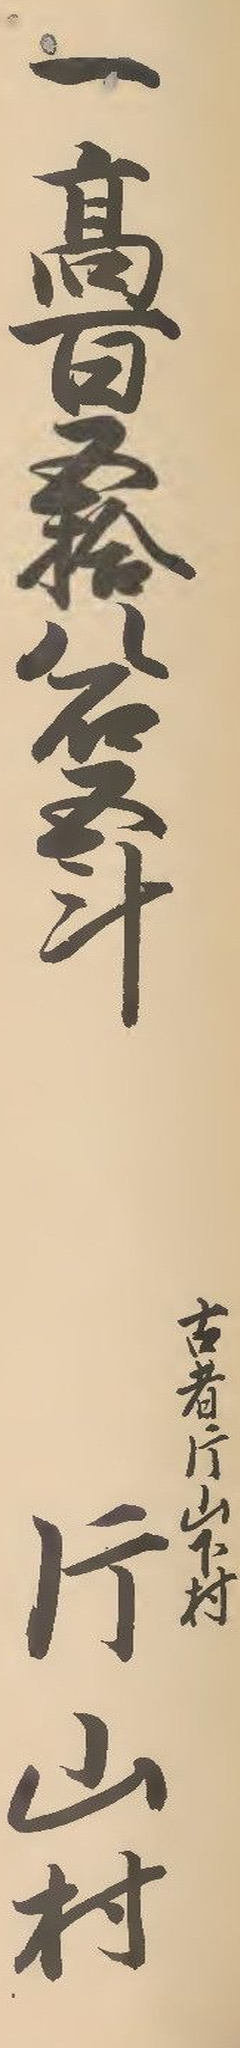一高百五拾八石五斗片山村
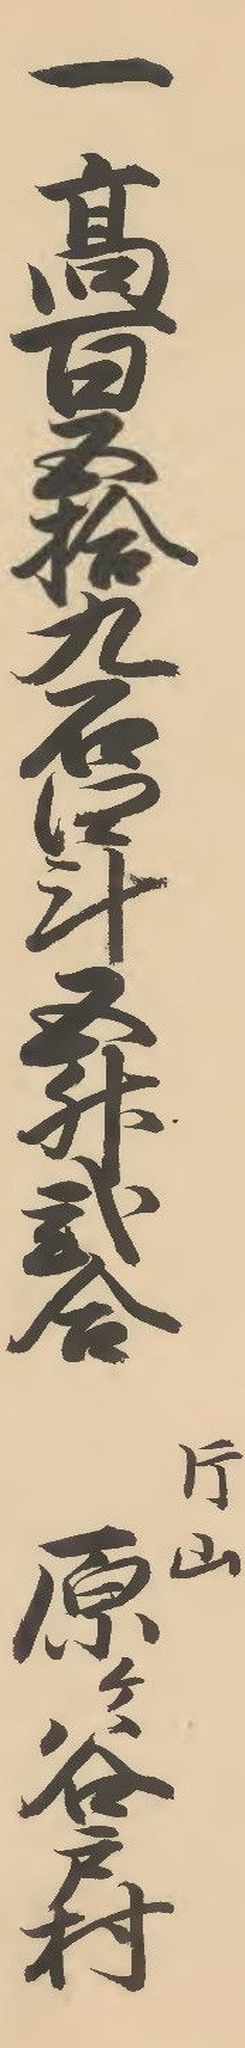一高百五拾九石四斗五升弐合原ヶ谷戸村
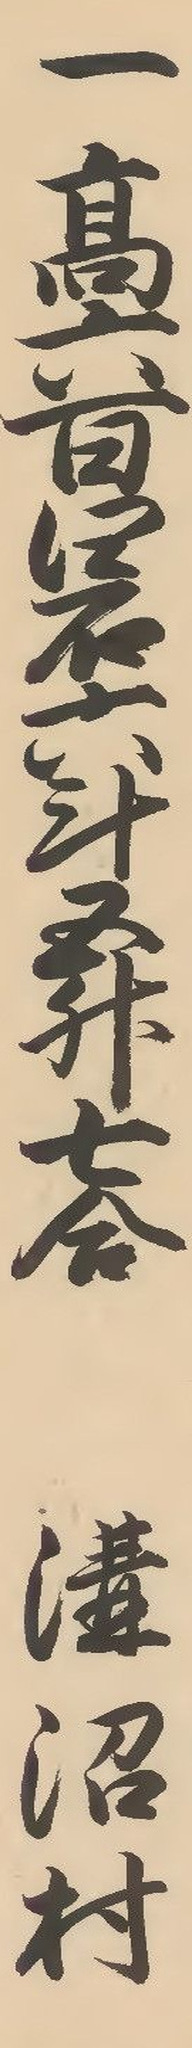一高六百四石六斗五升七合溝沼村

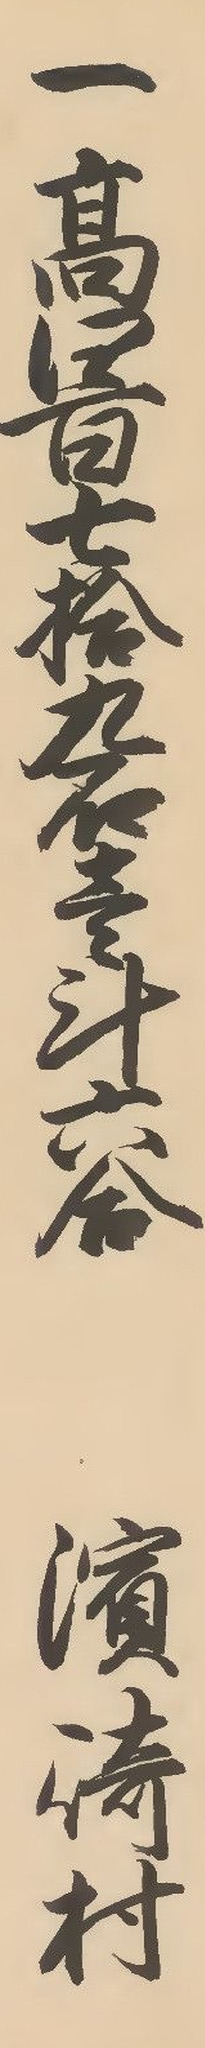一高四百七拾九石壱斗六合濱崎村
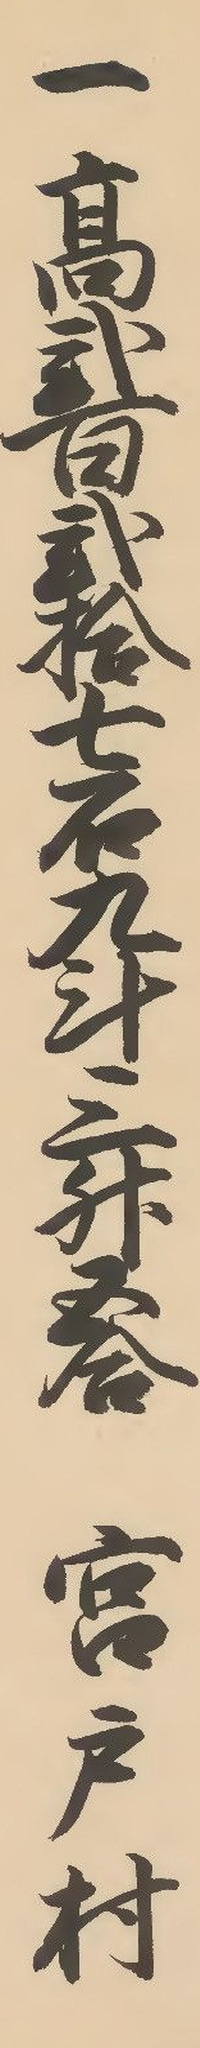一高弐百弐拾七石九斗三升五合宮戸村
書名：武蔵国郷帳　上
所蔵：国立公文書館 National Archives of Japan
